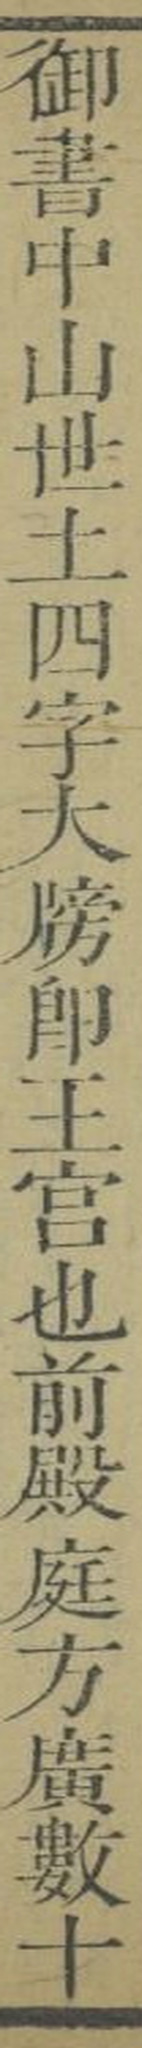御書中山世土四字大牓卽王宫也前殿庭方廣數十
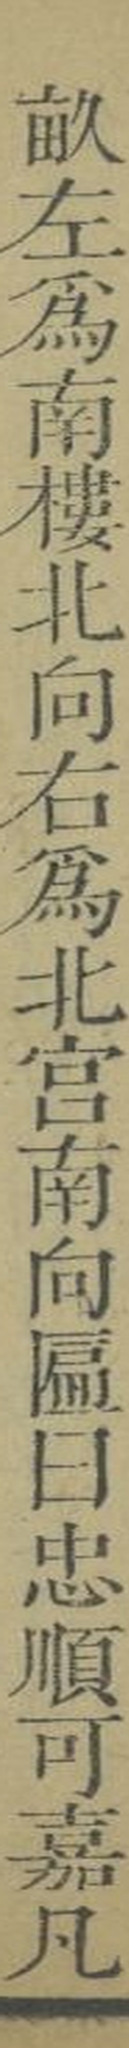畝左爲南樓北向右爲北宫南向匾曰忠順可嘉凡
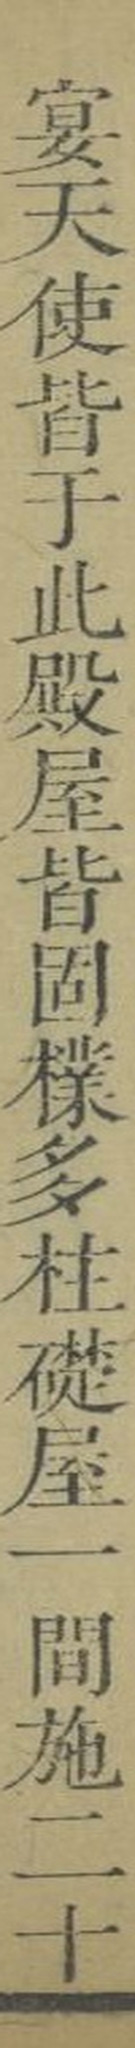宴天使皆于此殿屋皆固檏多柱礎屋一間施二十
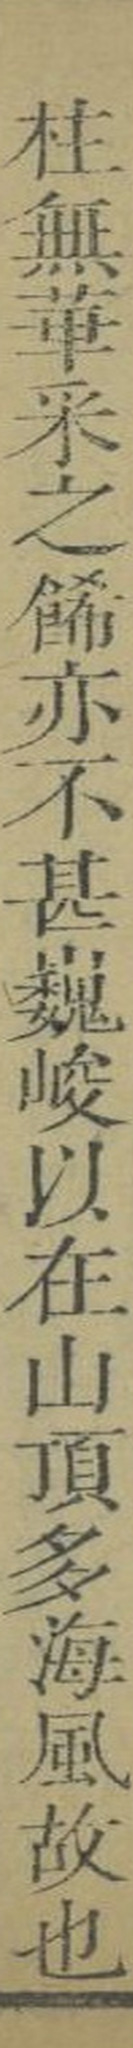柱無華采之餙亦不甚巍峻以在山頂多海風故也
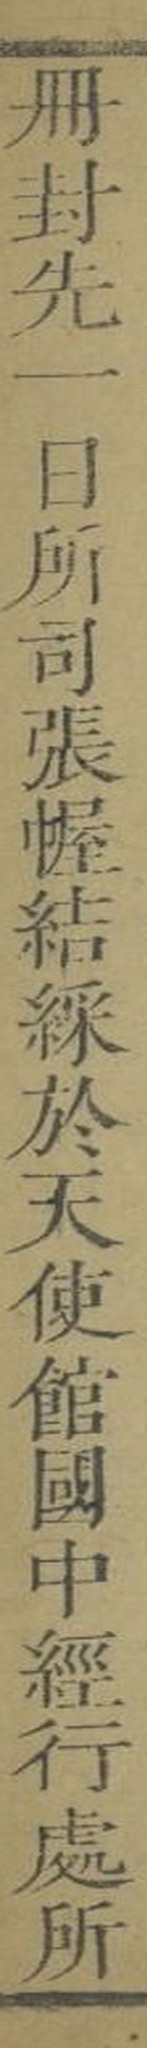冊封先一日所司張幄結綵於天使館國中經行處所

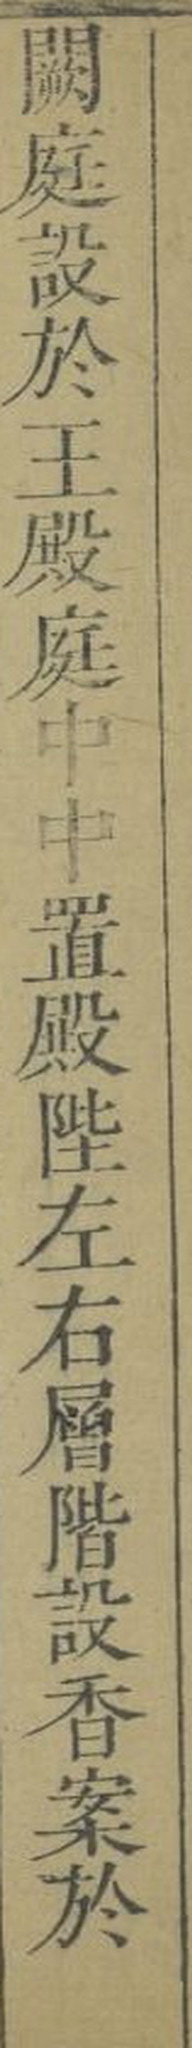闕庭設於王殿庭中中置殿陛左右層階設香案於
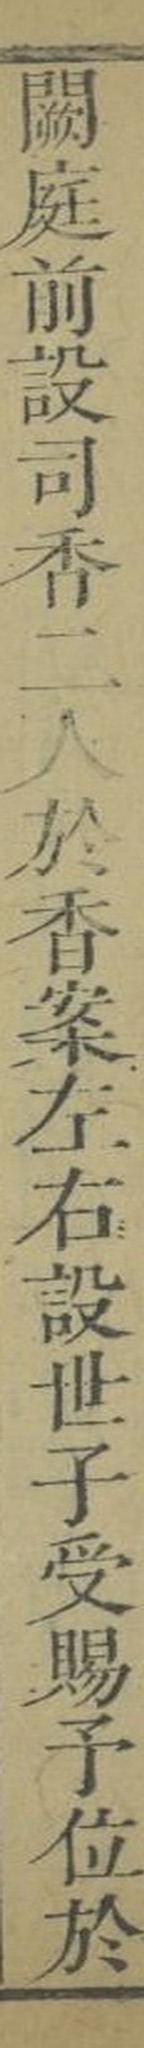闕庭前設司香二人於香案左右設世子受賜予位於
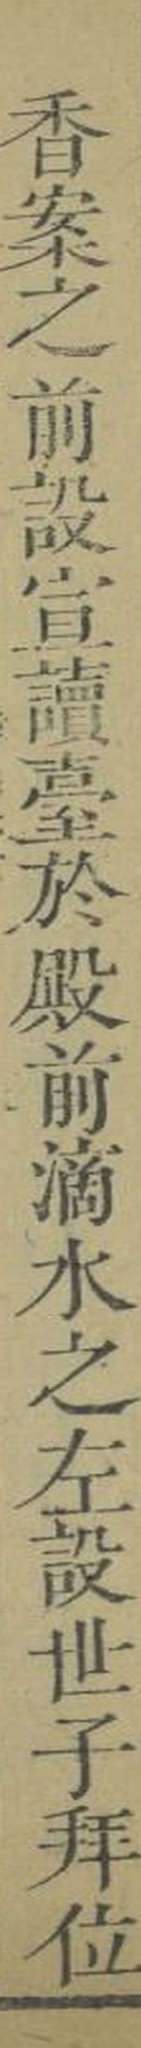香案之前設宣讀臺於殿前滴水之左設世子拜位
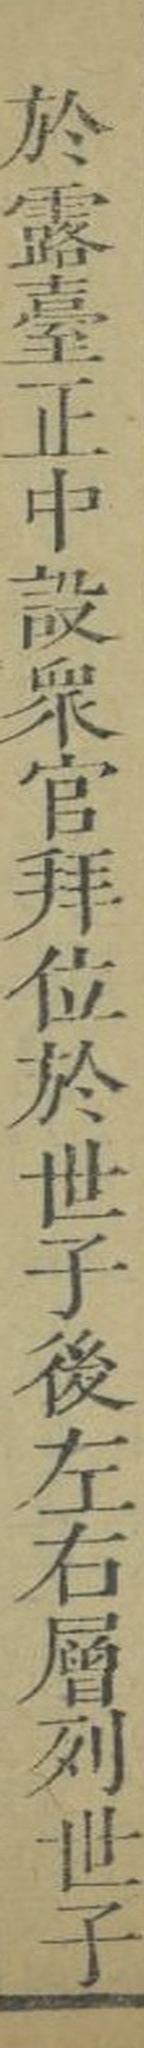於露臺正中設衆官拜位於世子後左右層列世子
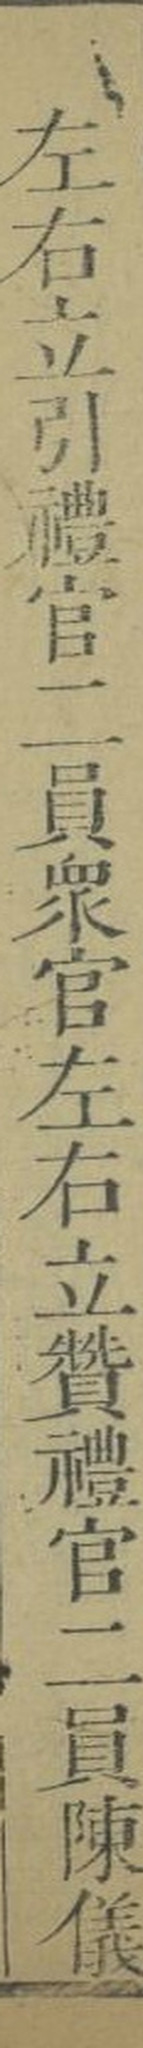左右立引禮官二員衆官左右立贊禮官二員陳儀
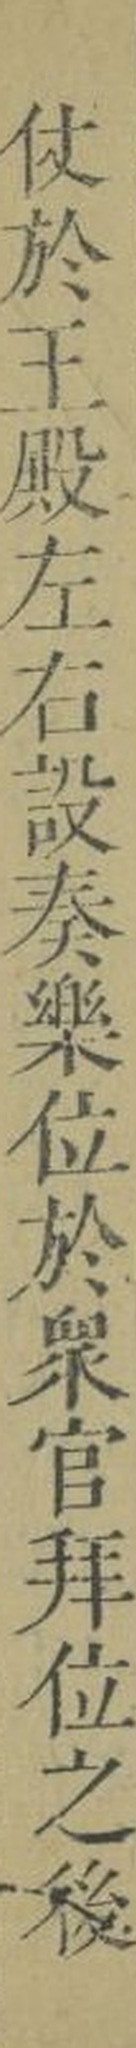仗於王殿左右設奏樂位於衆官拜位之後
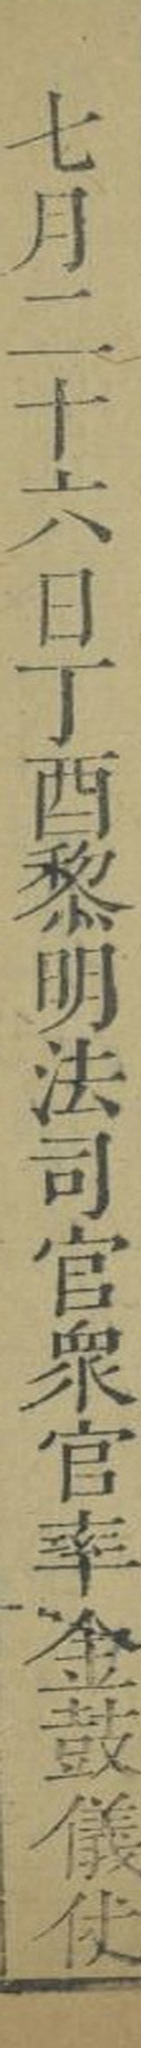七月二十六日丁酉黎明法司官衆官率金鼓儀仗
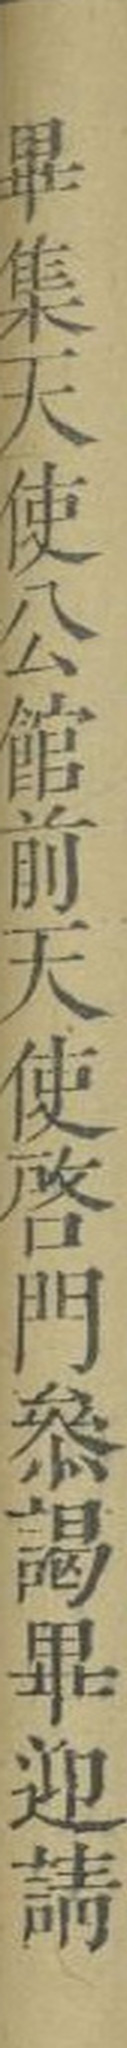畢集天使公館前天使啓門叅謁畢迎請
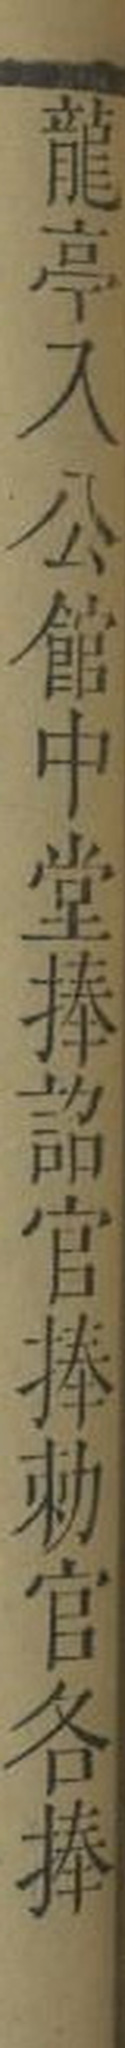龍亭入公館中堂捧詔官捧勅官各捧
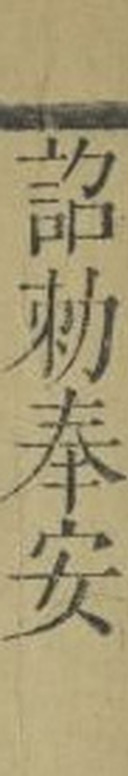詔勅奉安
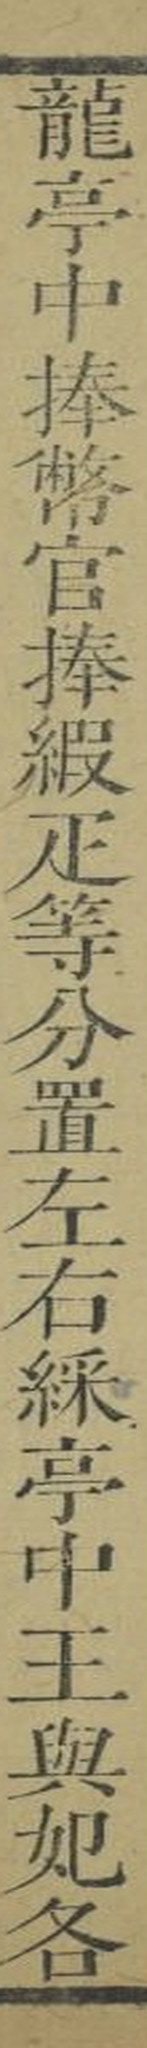龍亭中捧幣官捧縀疋等分置左右綵亭中王與妃各
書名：中山伝信録 巻二
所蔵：University of the Ryukyus Library
